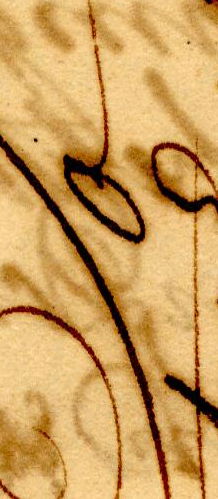To
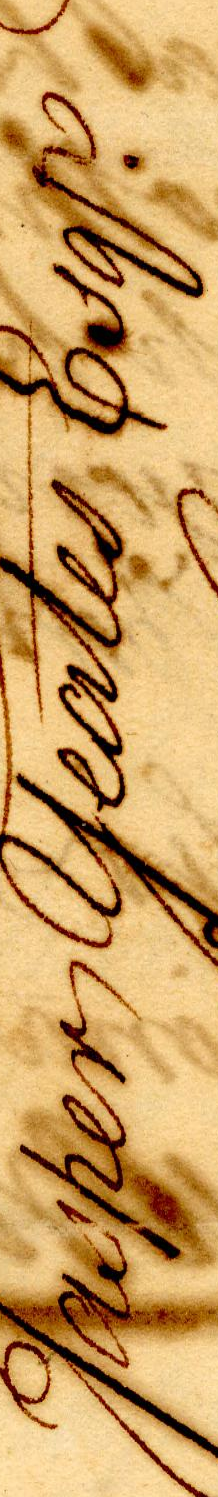Jasper Yeates Esq^r.
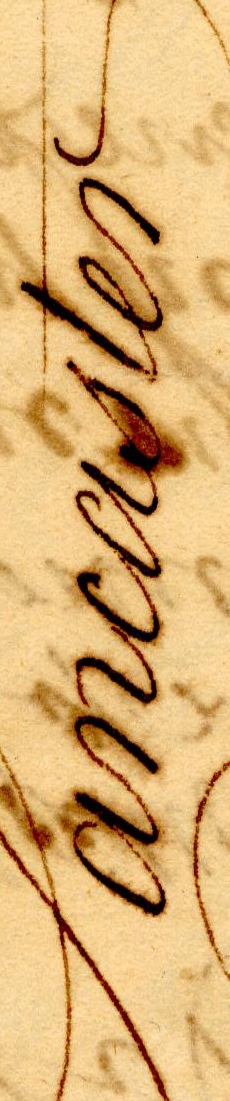Lancaster
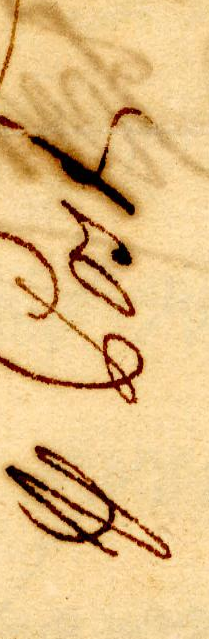Per Post
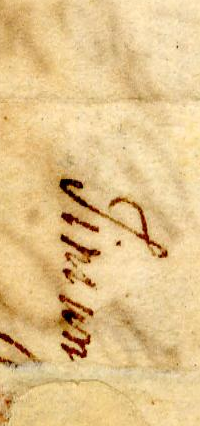Tinian
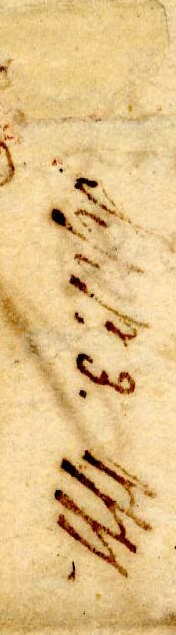Sept^r. 3. 1777.
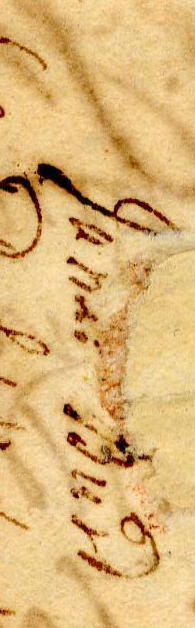James Burd
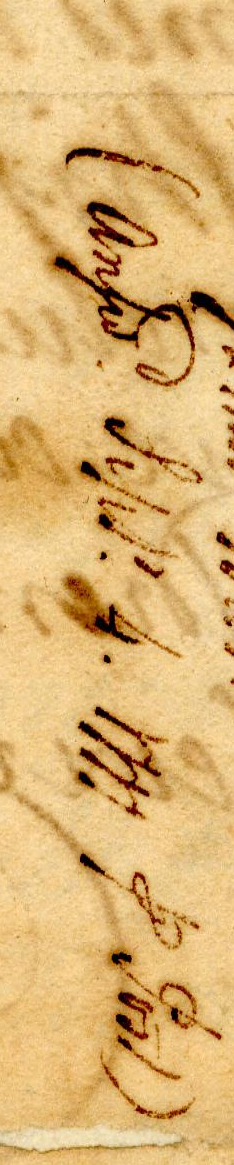(Answ^d. Sep^r. 4. 1777 per Post)
